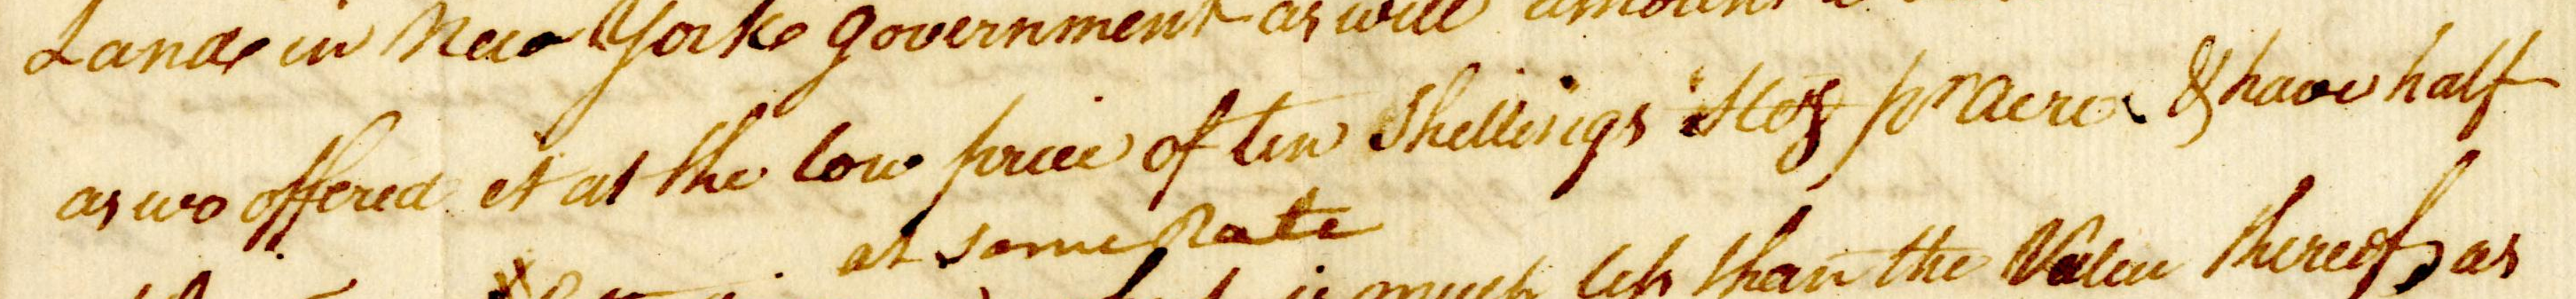as we offered, et at the low price of ten shillings ste^g p^r acre & have half
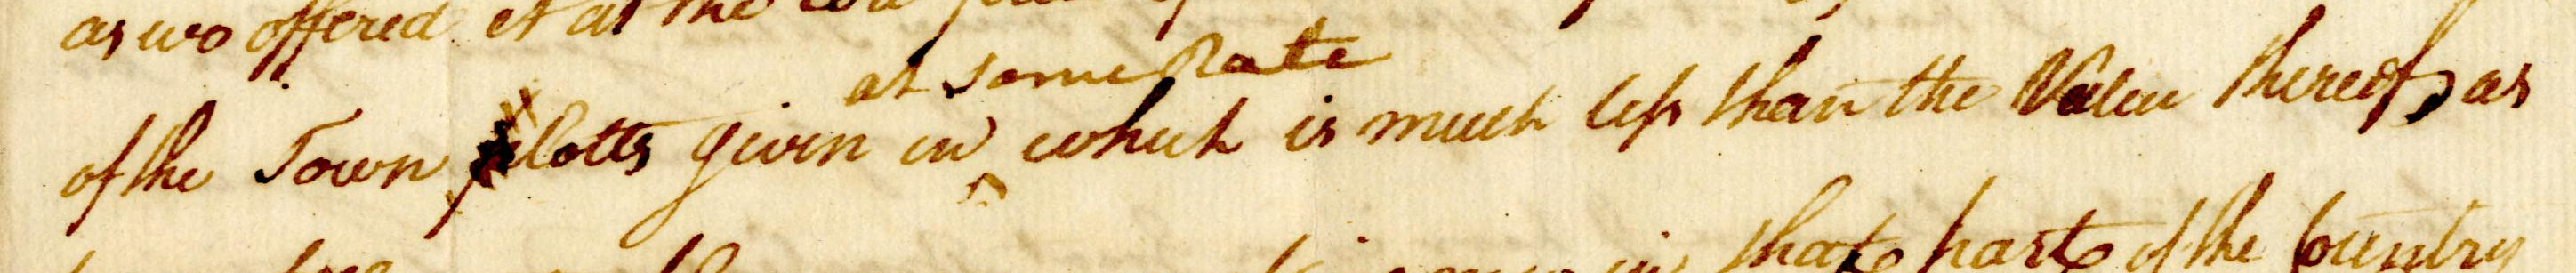of the Town [p]lotts given in, which is much less than the Value thereof, as
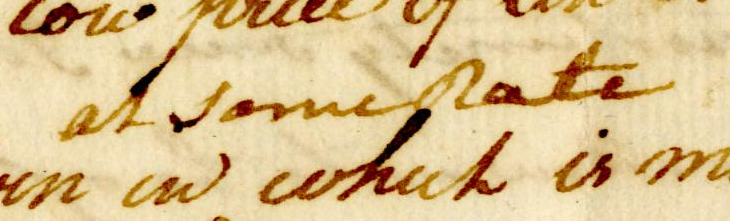at some rate
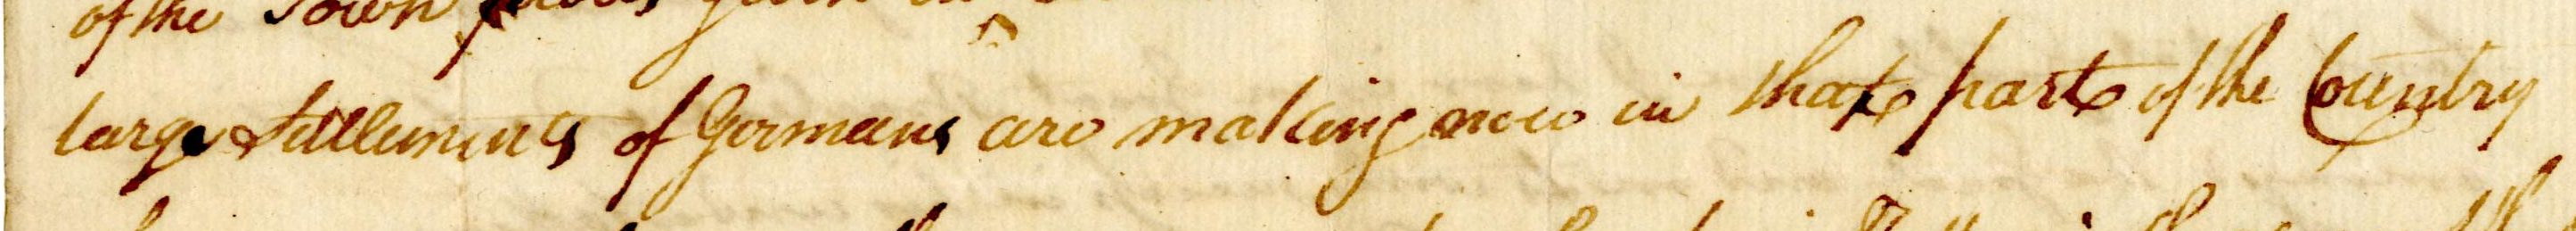large Settlements of Germans are making new in that part of the Country
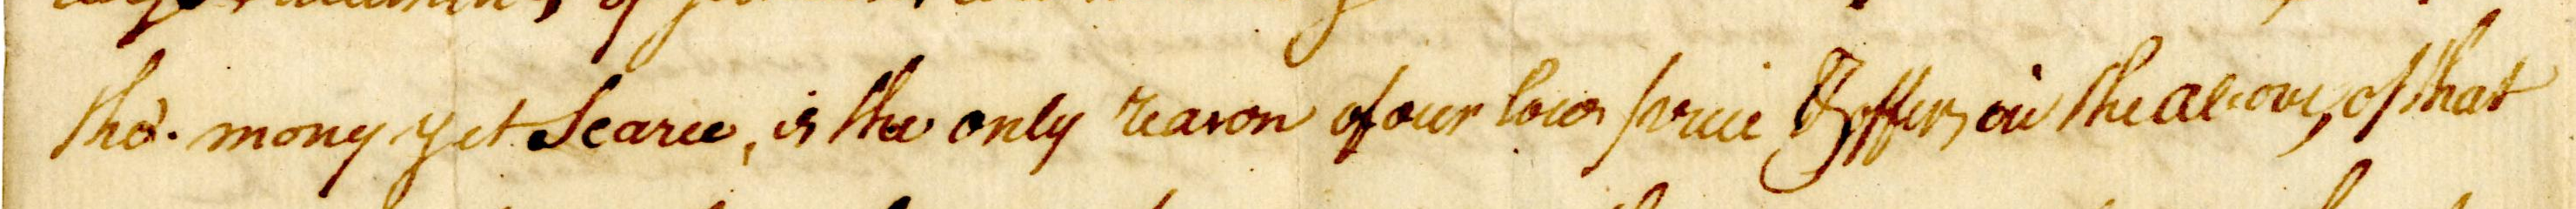the mony yet Scarce, is the only reason of our low price & offers, is the above, of that
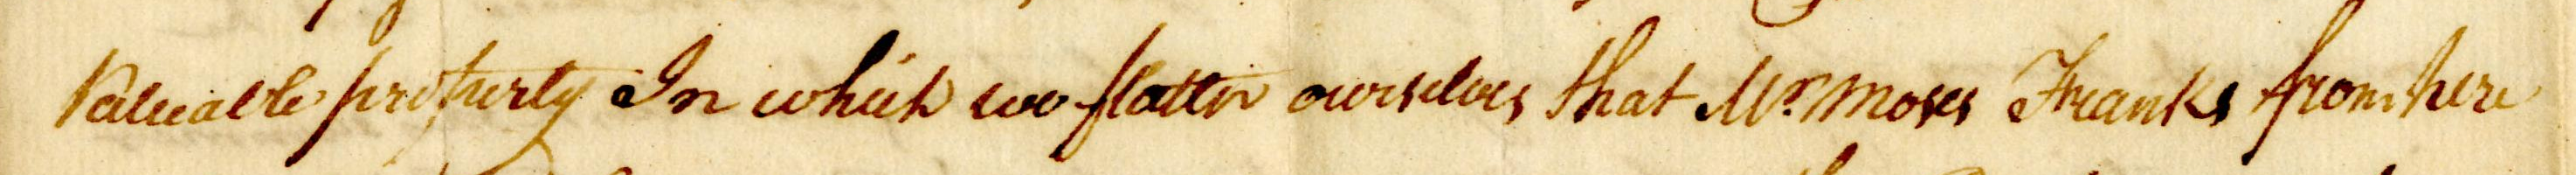Valueable property In which we flatter ourselves that M^r. Moses Franks from here
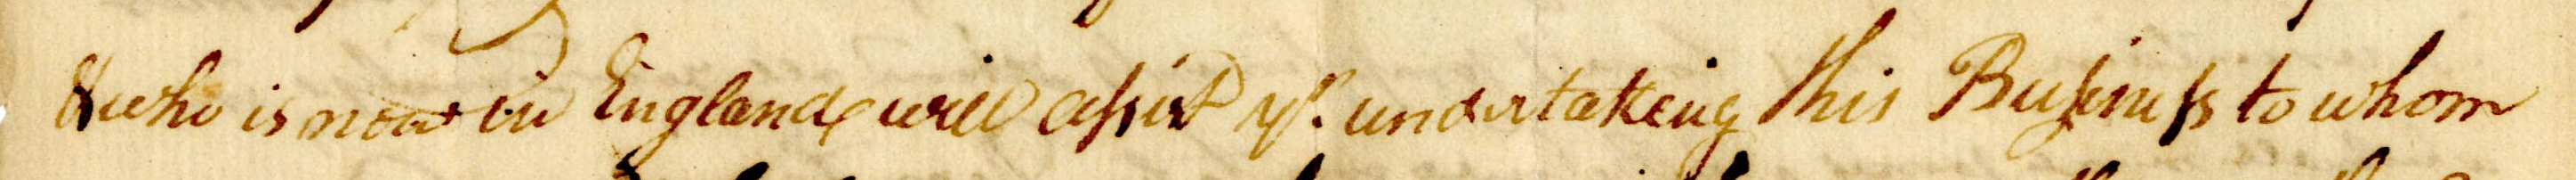& who is now in England will assist y^r. undertaking this Business to whom
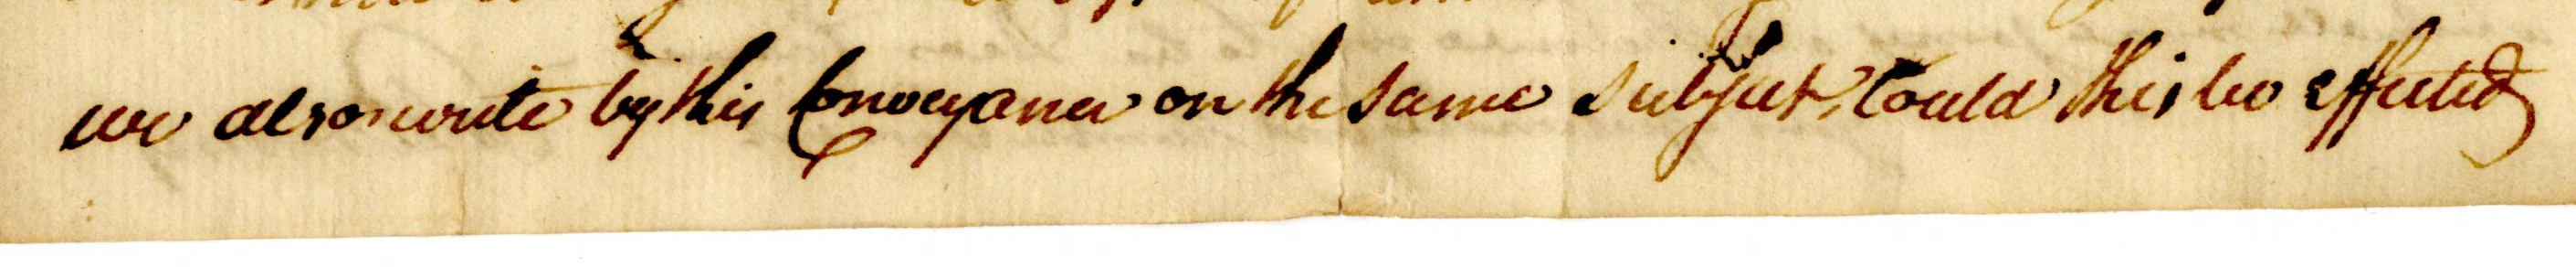we also write by this conveyance on the same subject could this be effected
